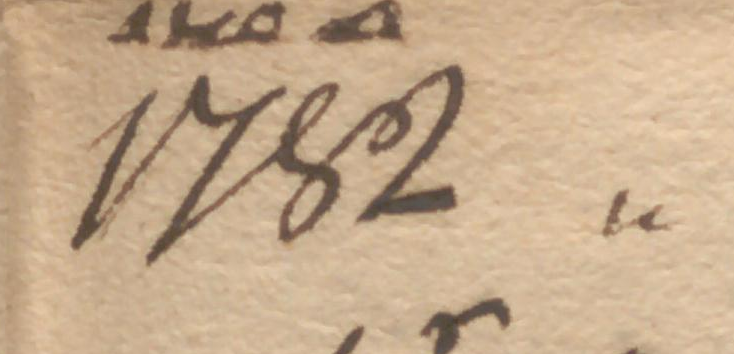1782
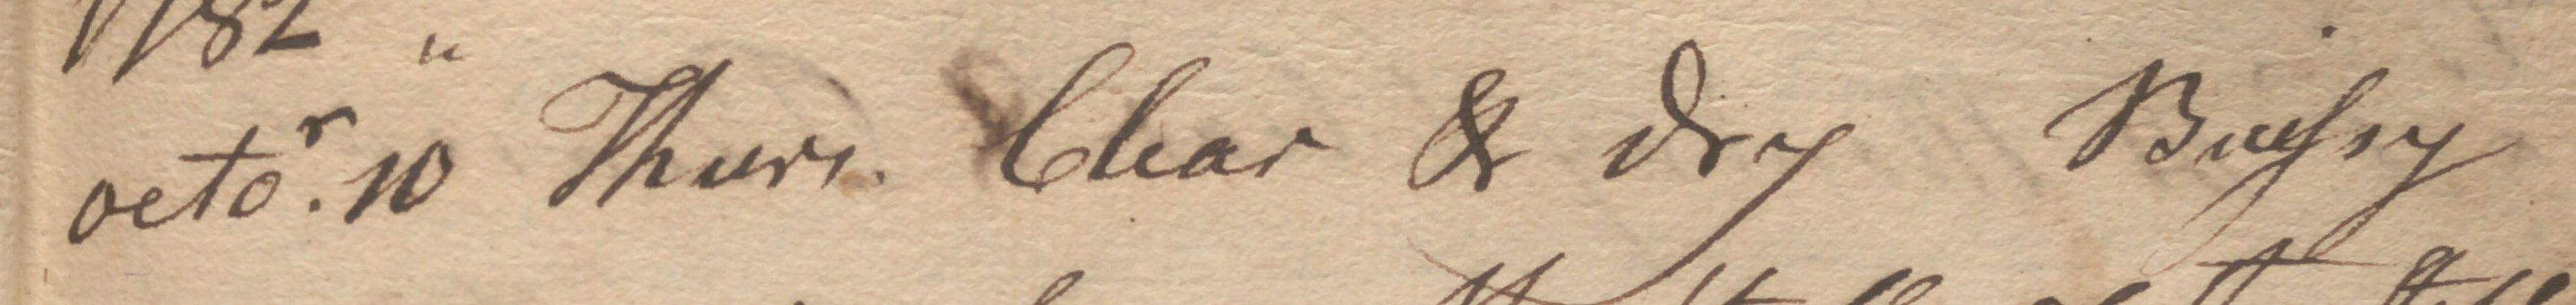octo^r. 10 Thurs. Clear & dry Buissy
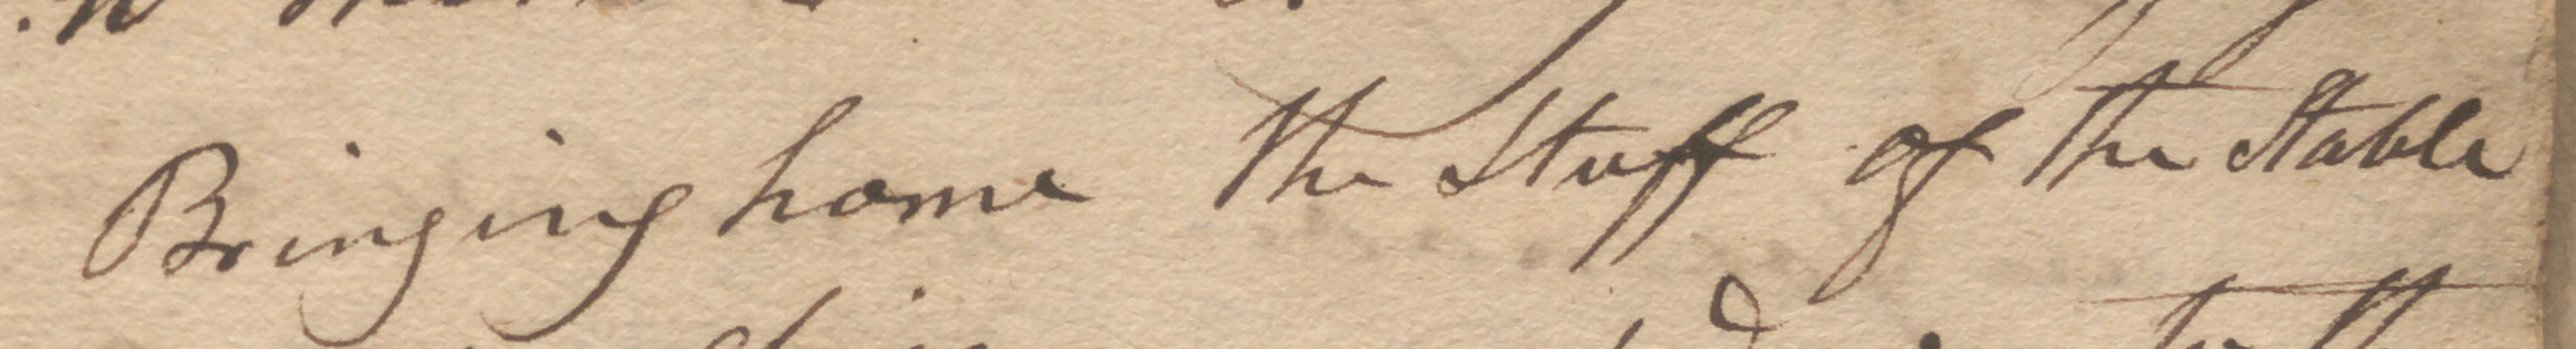Bringing home the Stuff of the stable
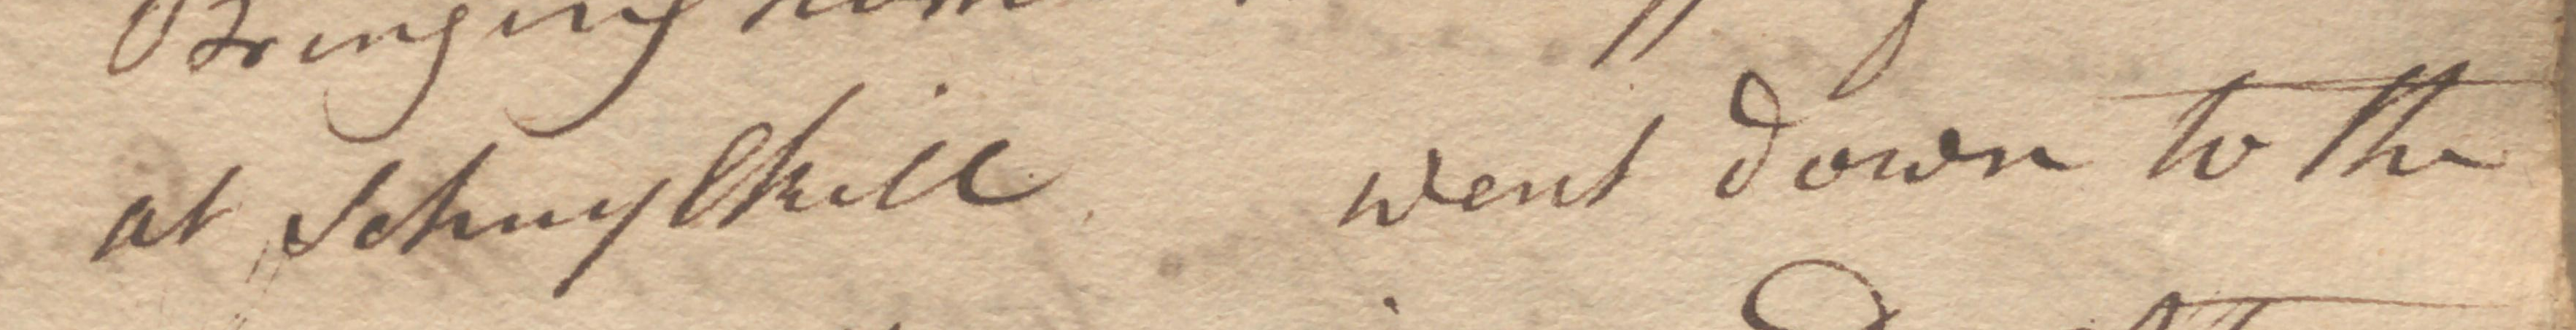at Schuylkill, went down to the
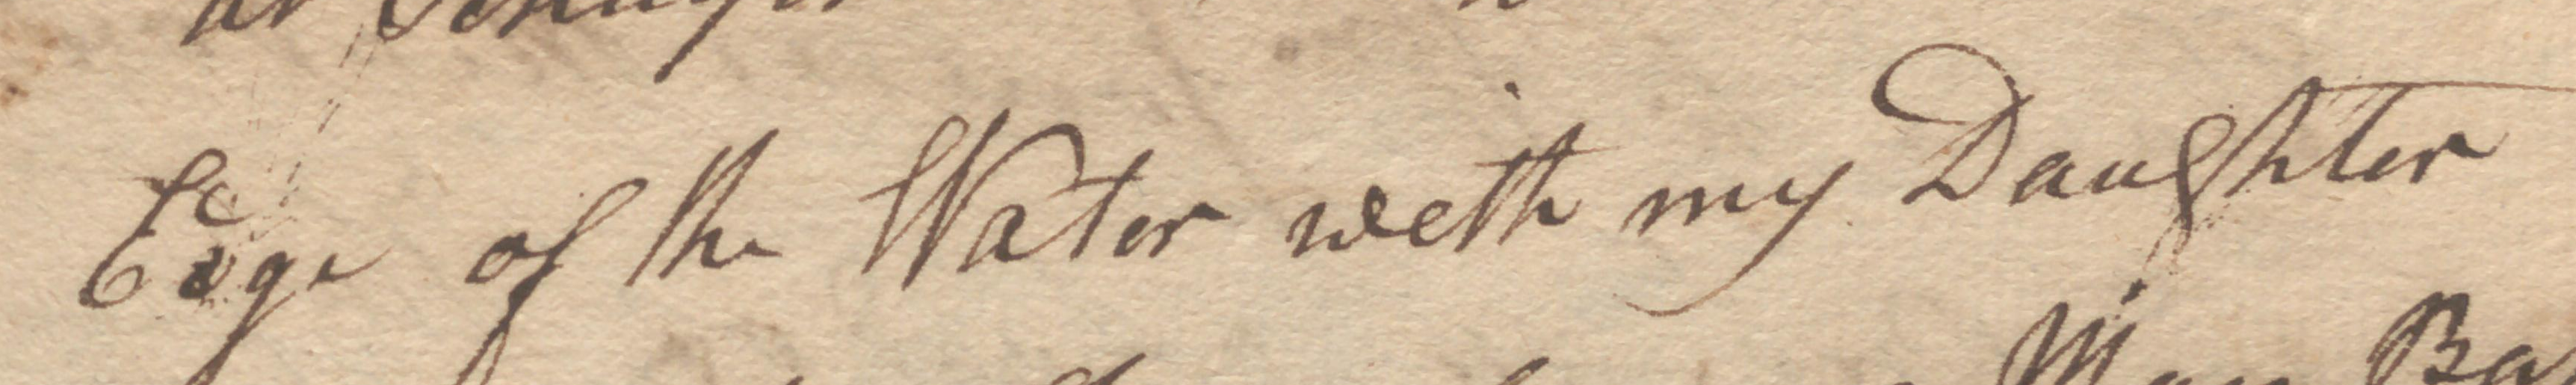Edge of the Water with my Daughter
